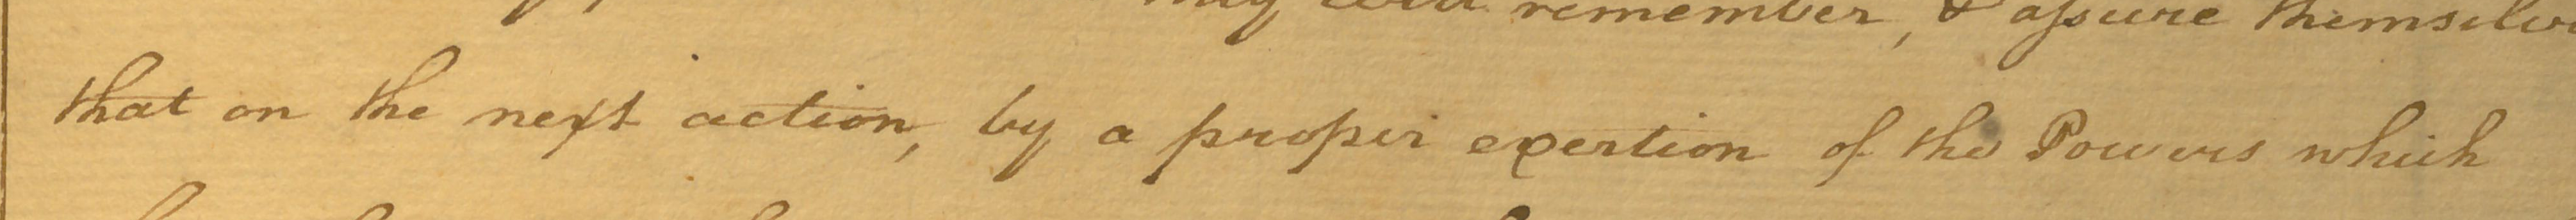that on the next action, by a proper exertion of the Powers which
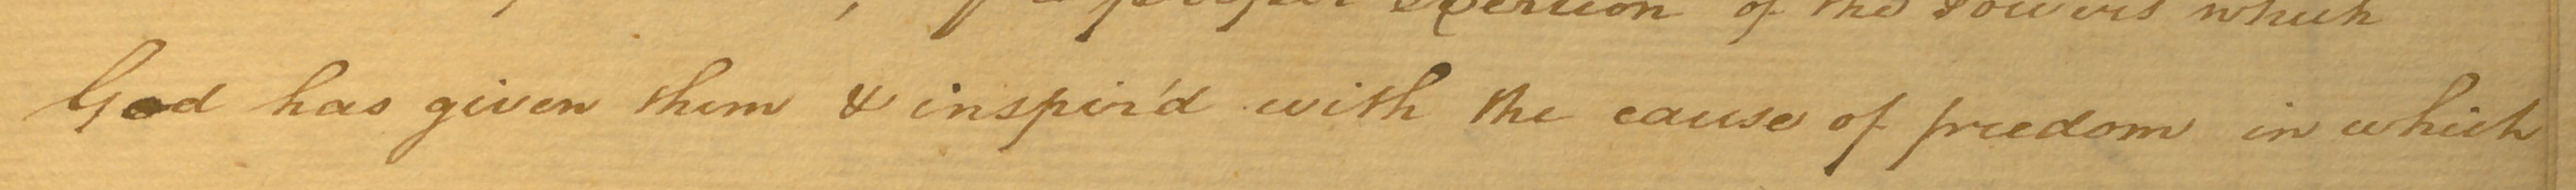God has given them & inspir'd with the cause of freedom in which
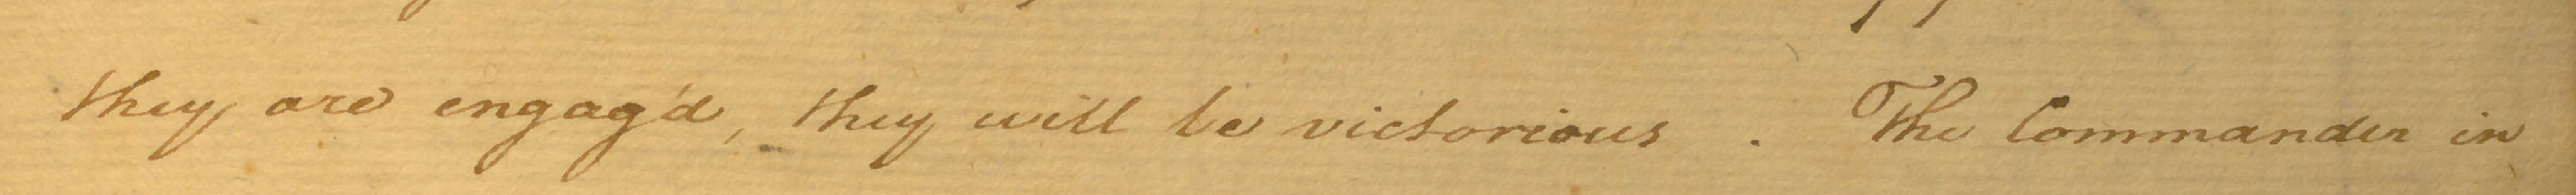they are engag'd, they will be victorious. The Commander in
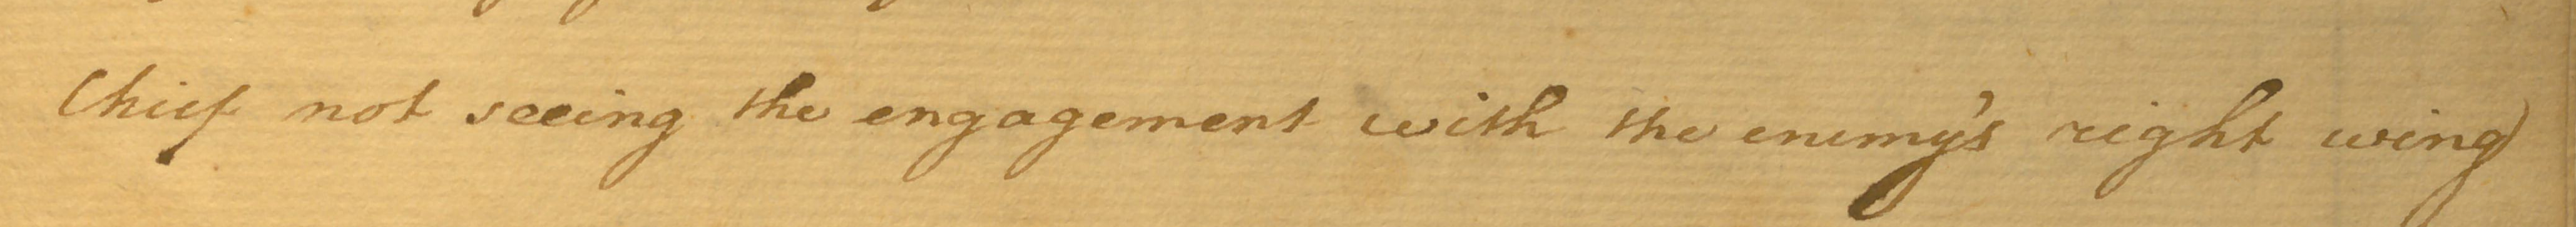Chief not seeing the engagement with the enemy's right wing
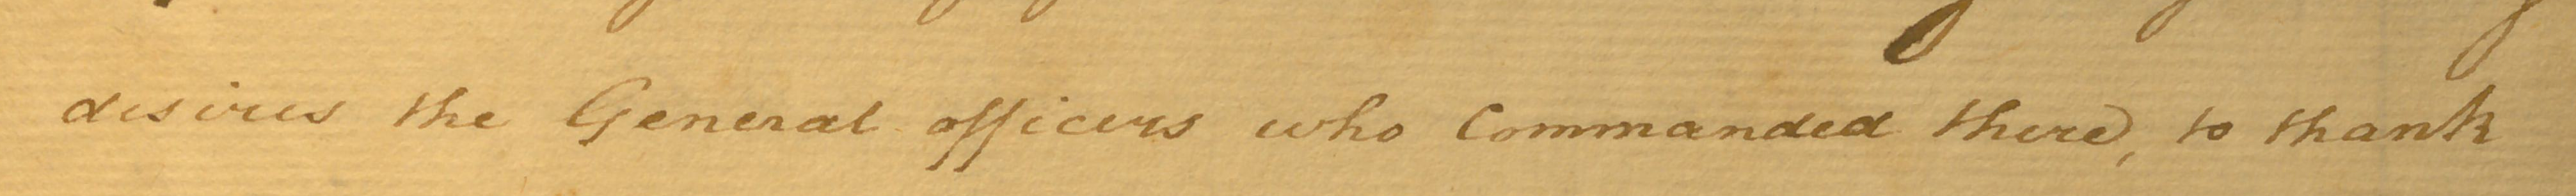desires the General officers who Commanded there, to thank
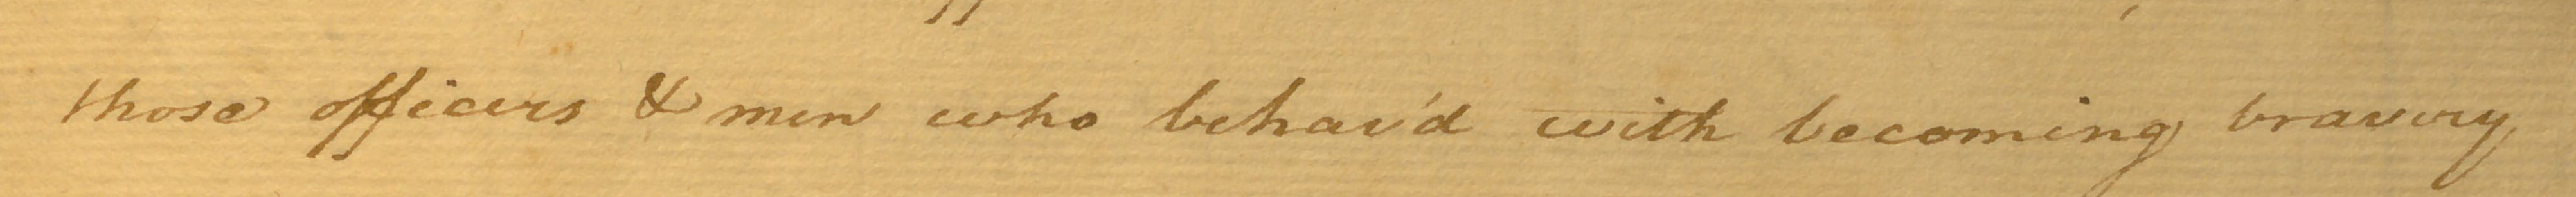those officers & men who behav'd with becoming bravery
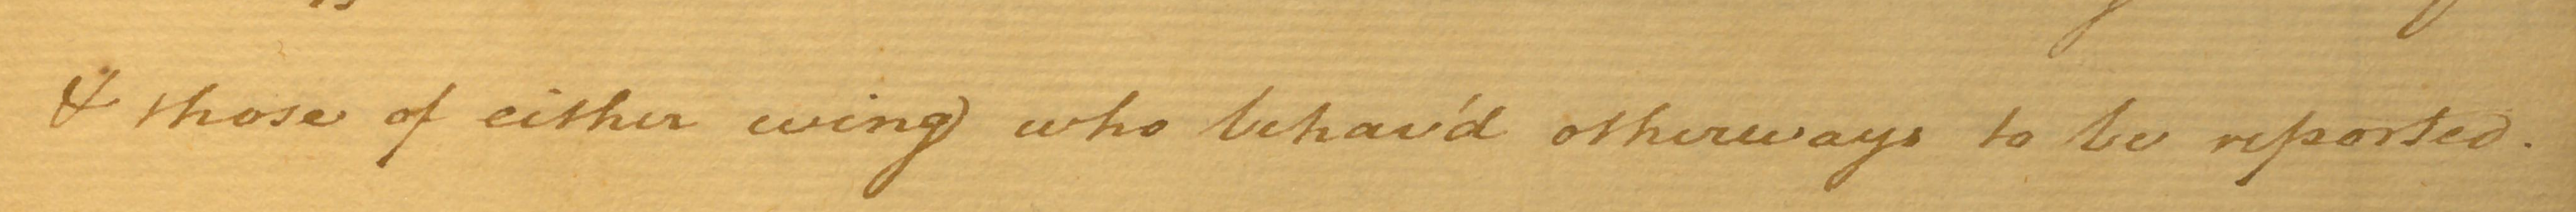& those of either wing who behav'd otherways to be reported.
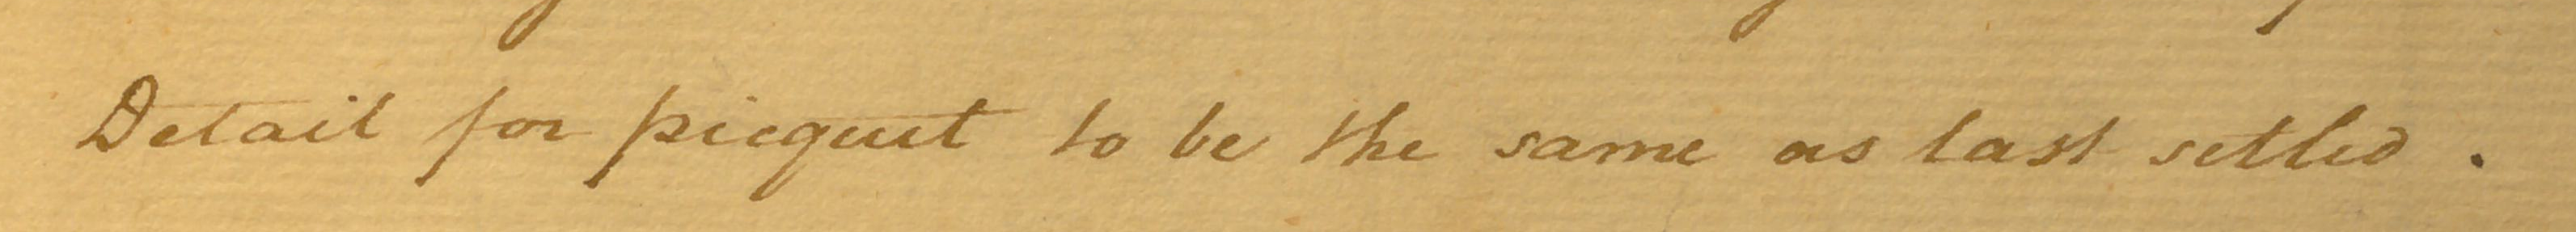Detail for picquet to be the same as last setled.
